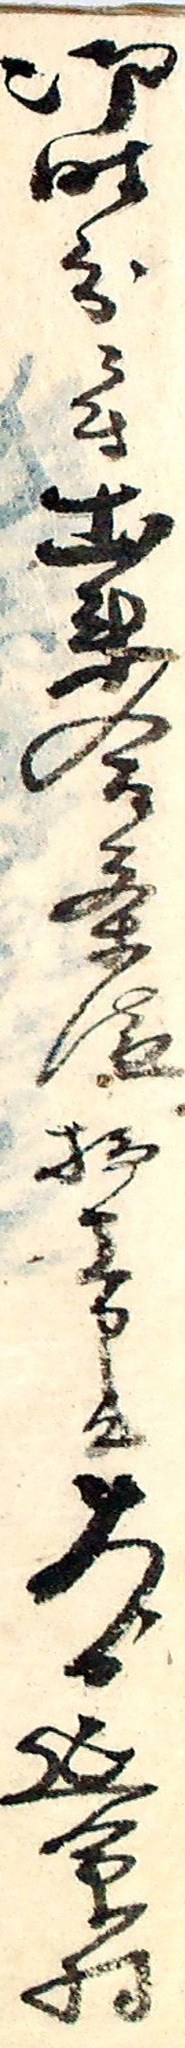御時分に付出来合茶漬指申候夫ゟ延命村
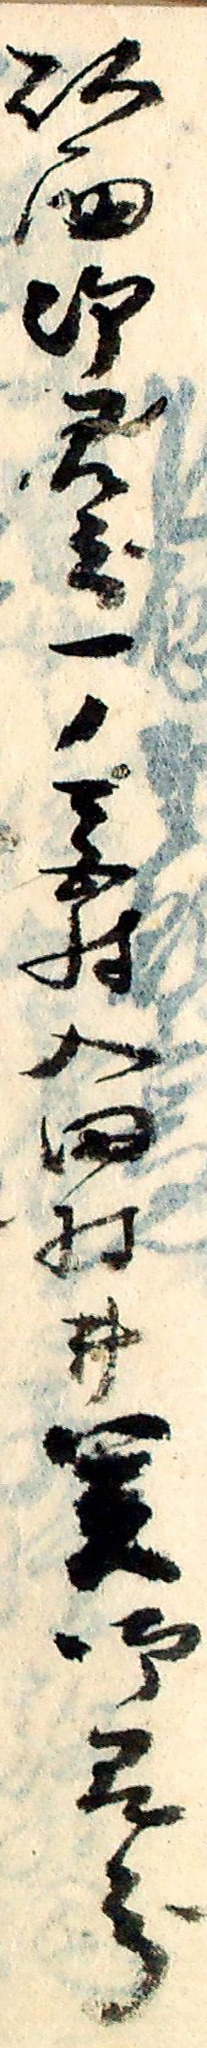以西御見分一ノ宮村入田村井関御見分
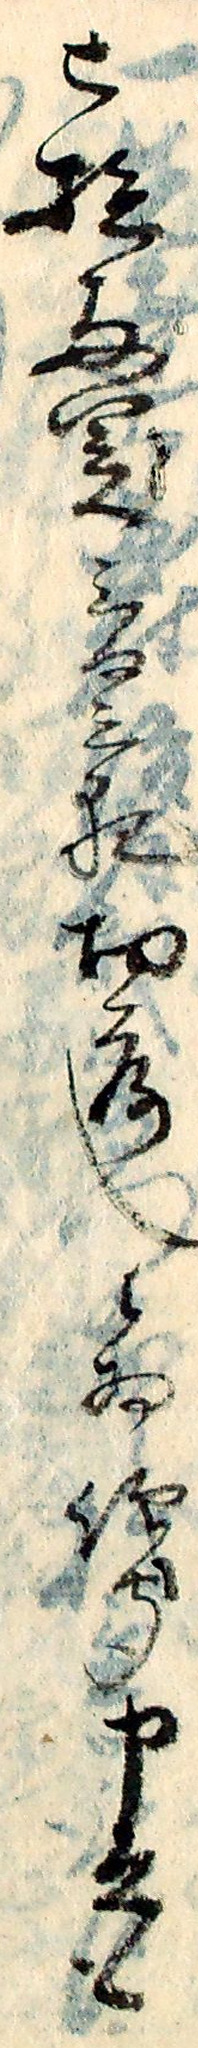被遊両関三日三夜切落し被為仰聞申候以上
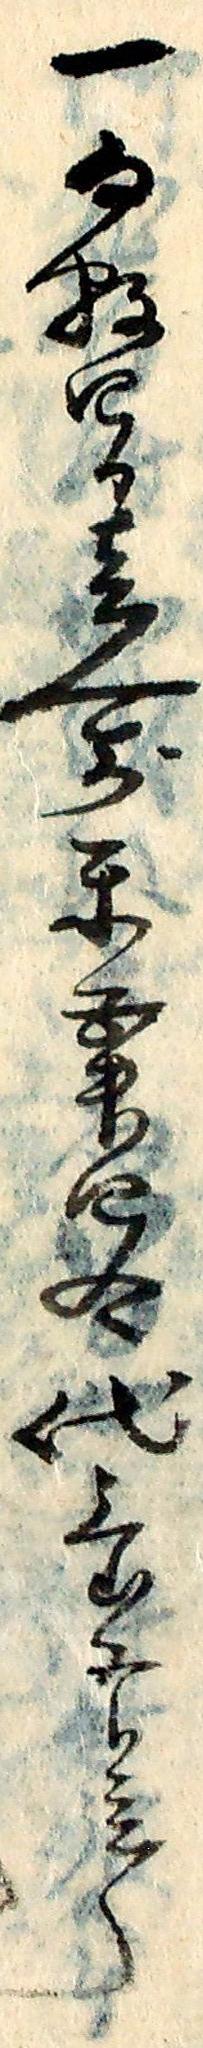一日数四日壱人前米五升四合代三匁五分壱り
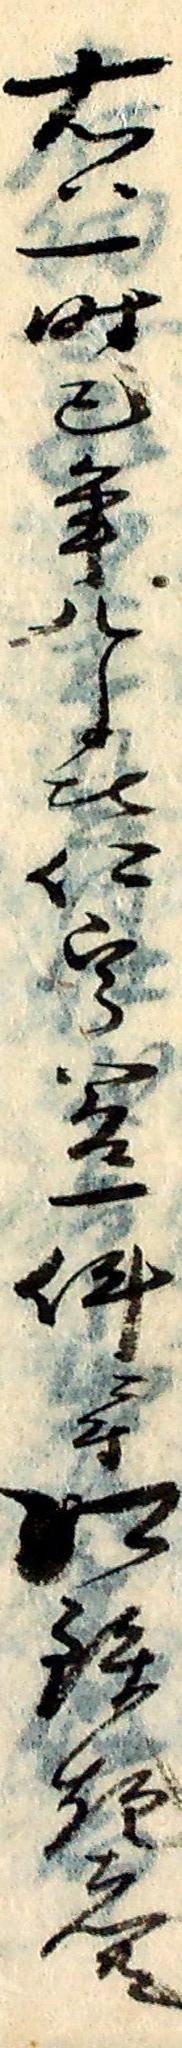右は一時巳年八月比仁宇谷一件に付郷鉄炮者共
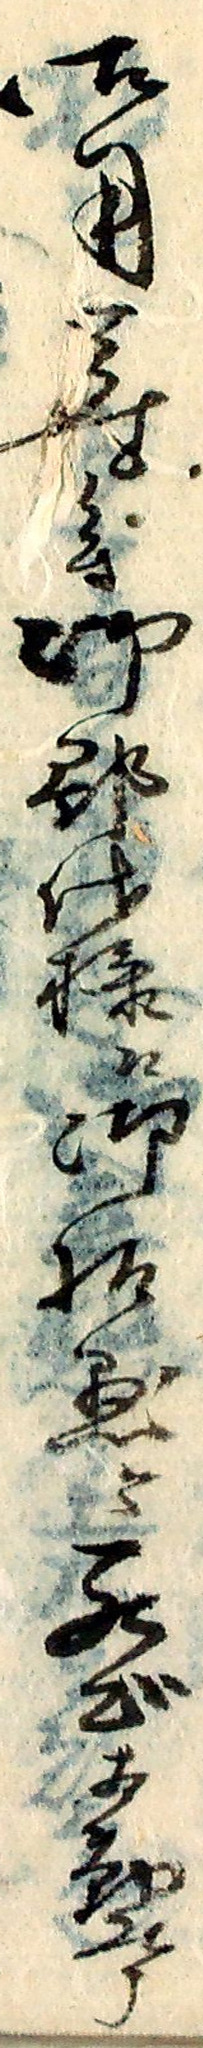御用御座候付御郡代様え御扣懸罷出相勤居申
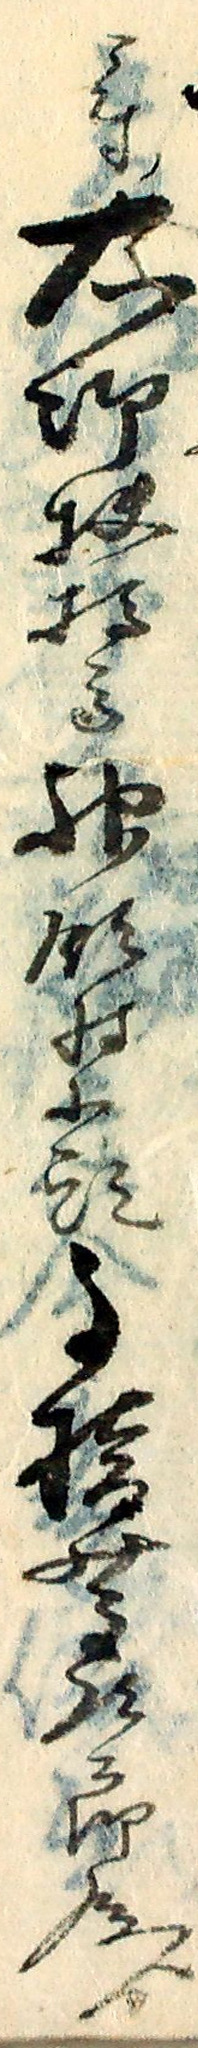に付右御扶持高神領村小頭高橋芳次郎殿ゟ
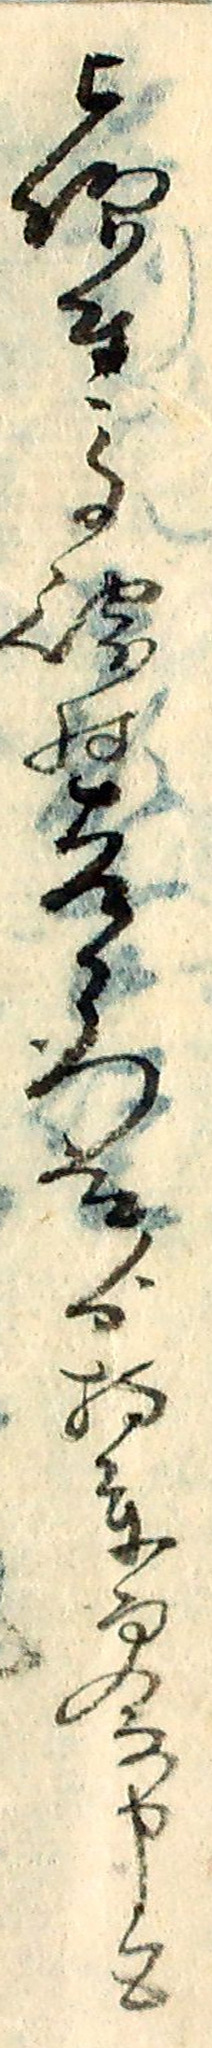被仰付高崎村吉右衛門殿ゟ持参受取申候
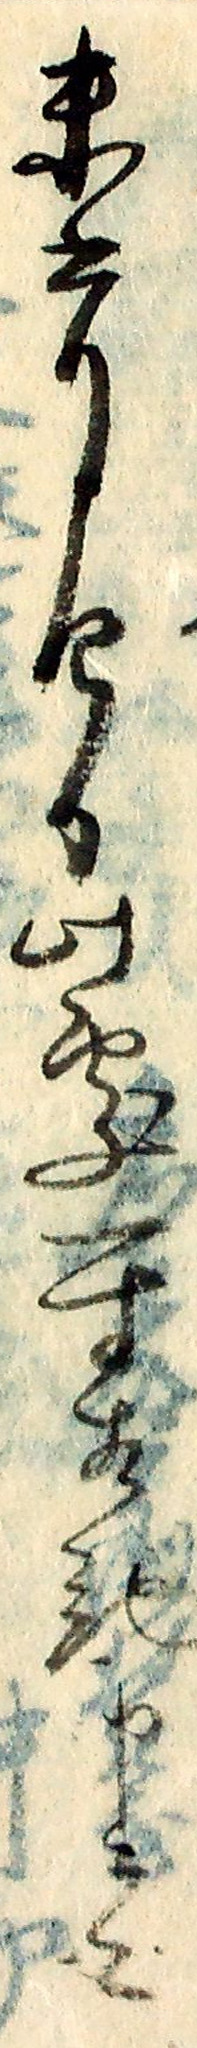未六月四日此処一寸相記申候以上

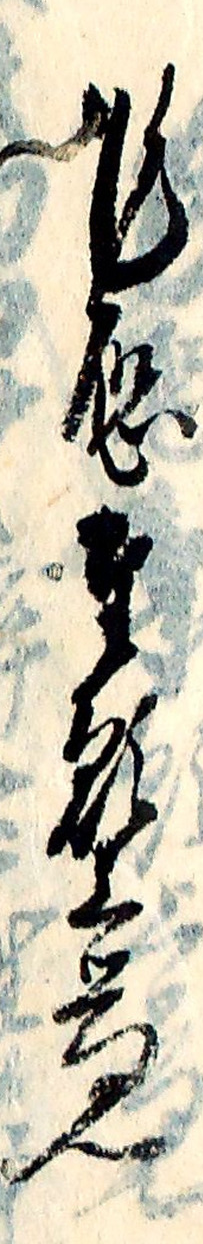乍恐奉願上覚
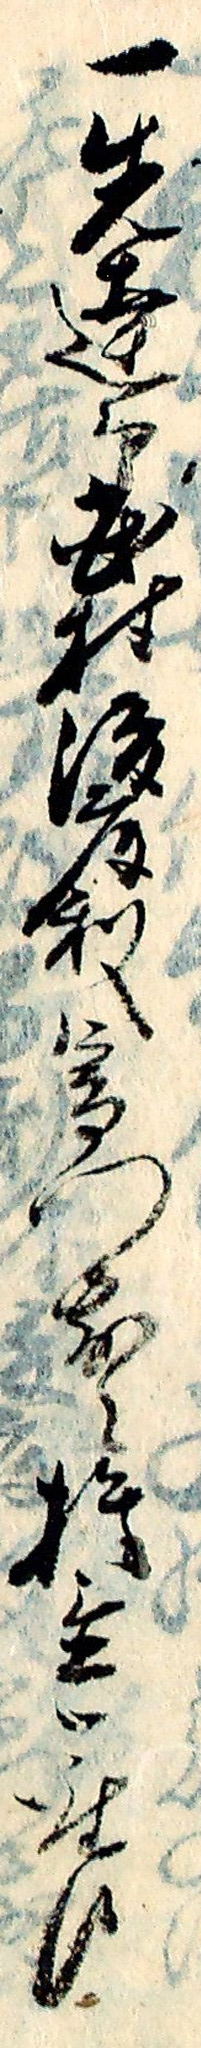一先達て当村後藤利八郎門前に捨置御座候
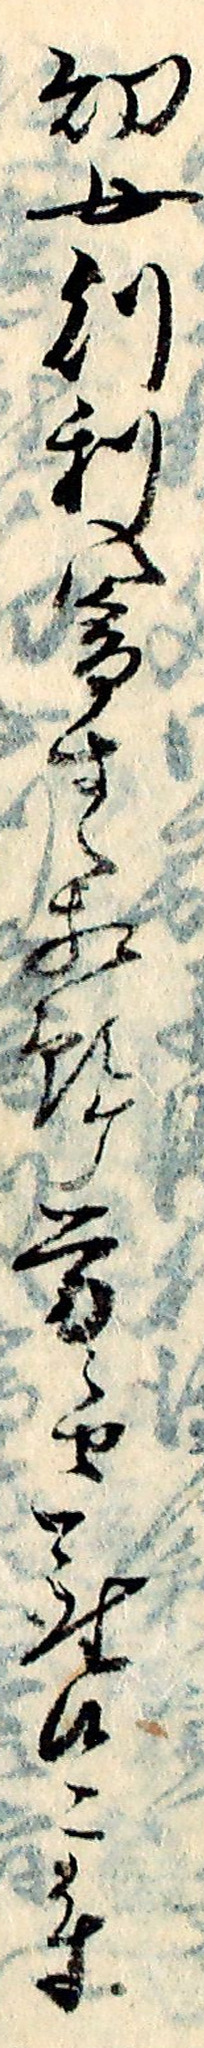幼女則利八郎方へ相預け労らせ御座候に付
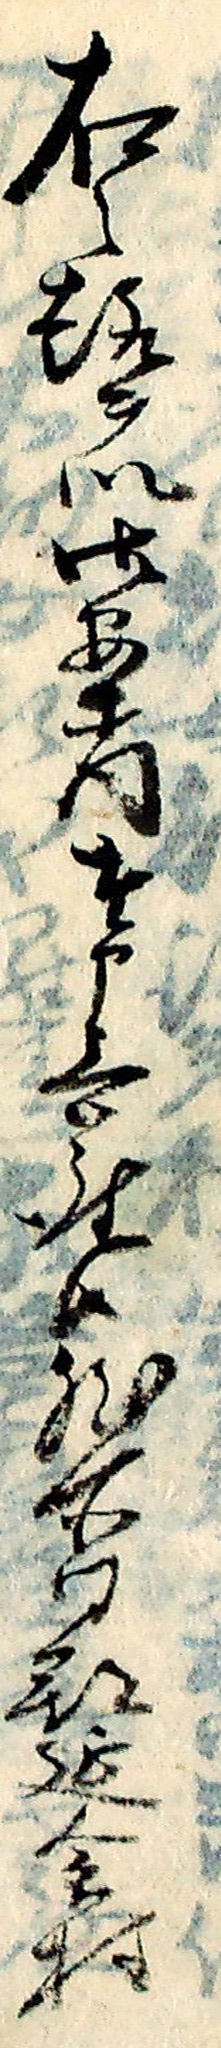右之趣を以御案内奉申上御座候然所同郡延命村
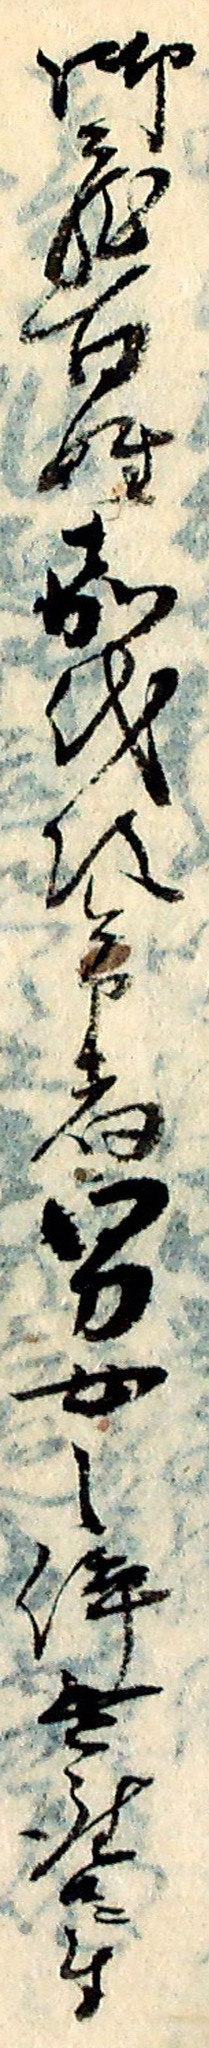御蔵百姓嘉代次と申者男女の倅無座候に付
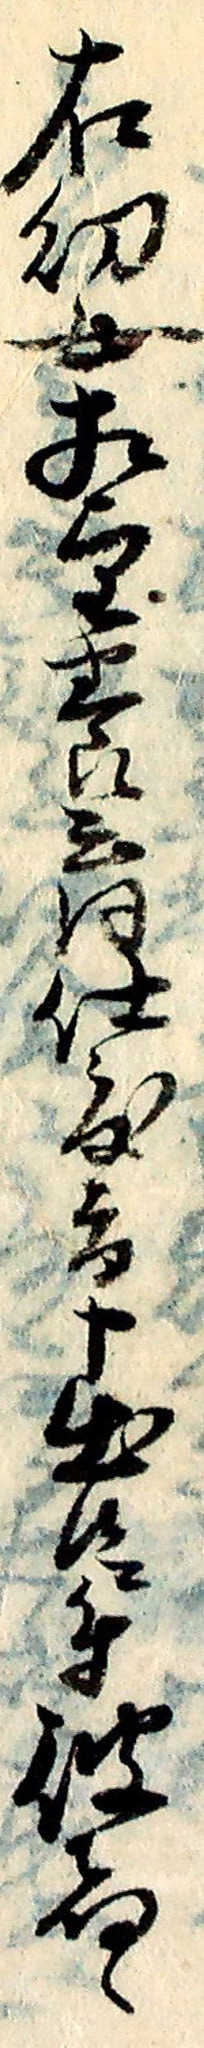右幼女相望養育仕度旨申出候に付彼者へ
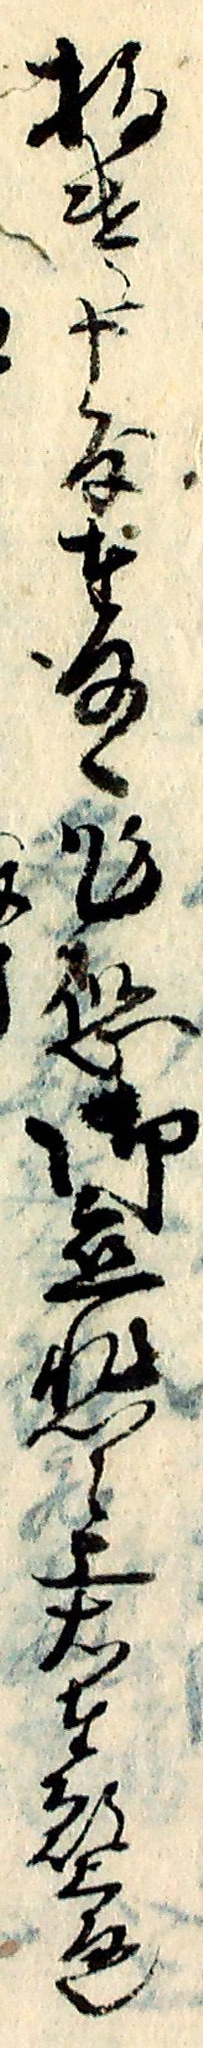指遣し申度奉存候乍恐御慈悲之上右奉願上通
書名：諸御願書控(後藤氏壱番）
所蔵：鳴門教育大学 Naruto University of Education
